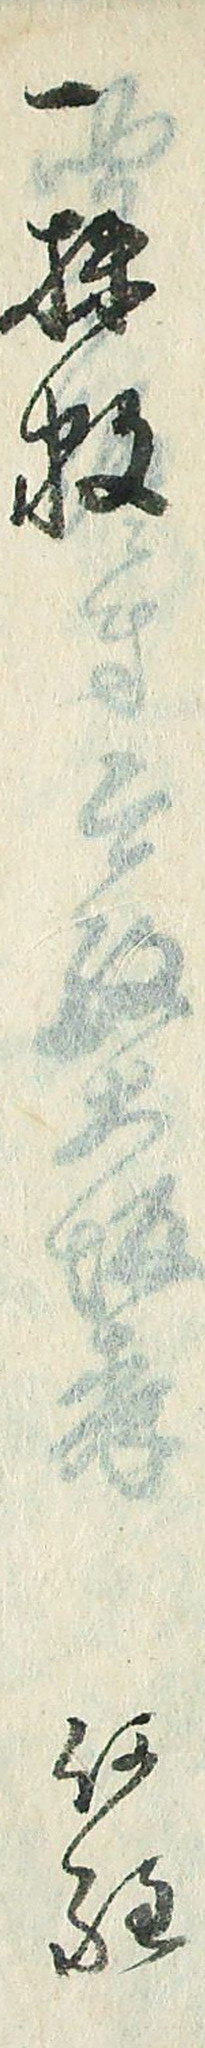一株数何程
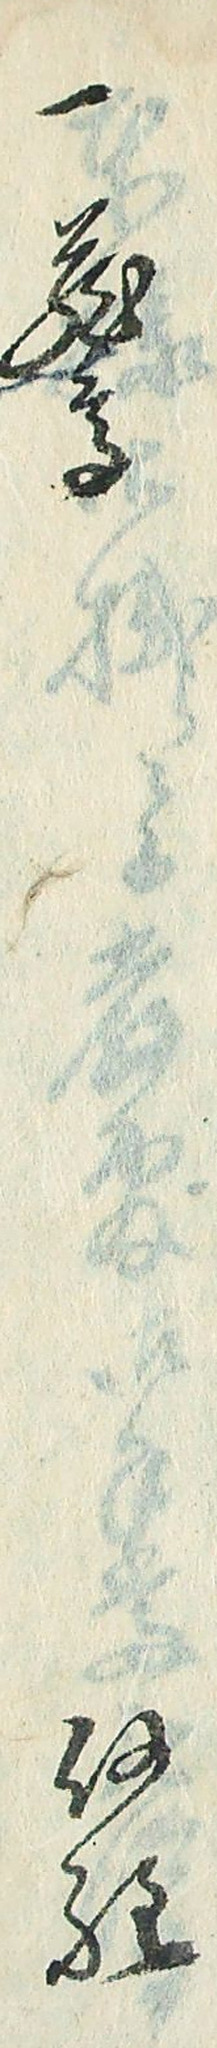一蔵高何程

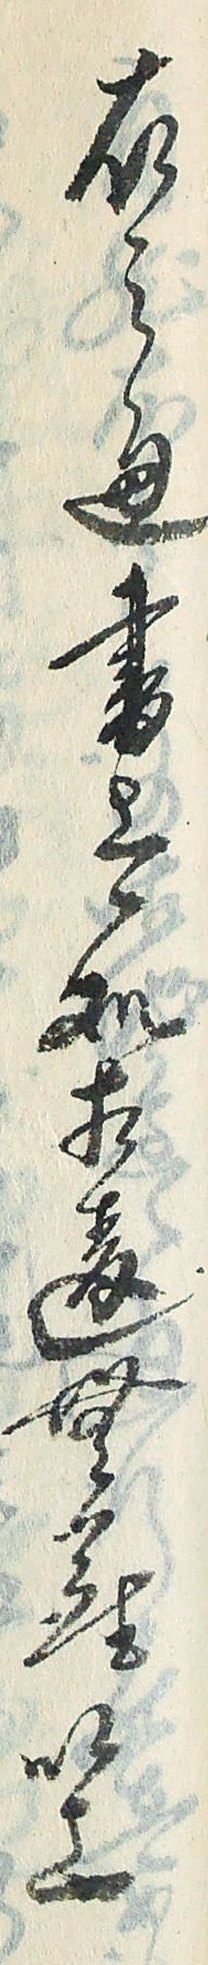右之通書上候処相違無御座候以上
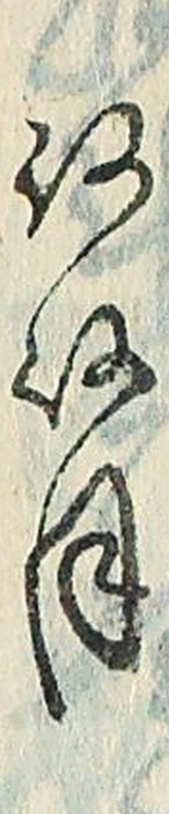何何月
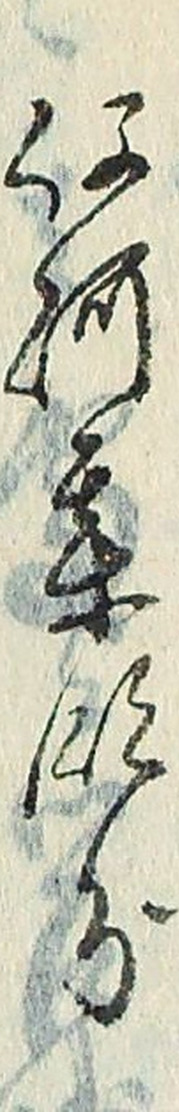何何某領分
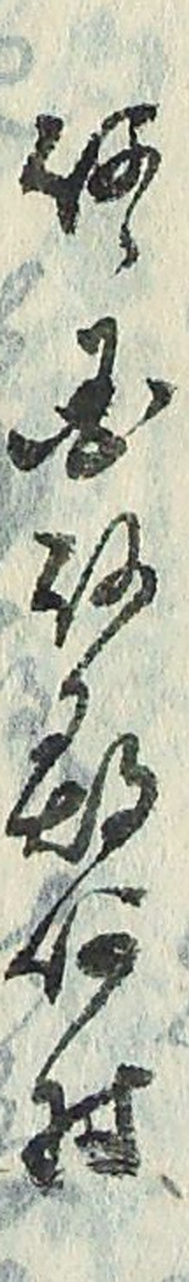何国何郡何村
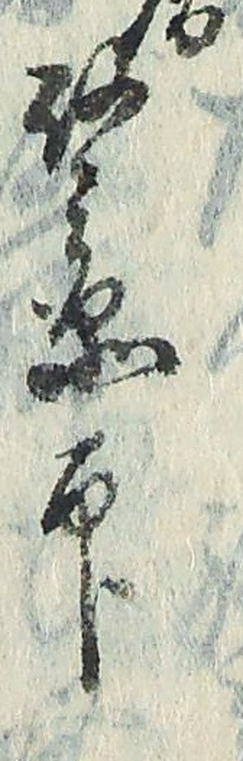何兵衛印
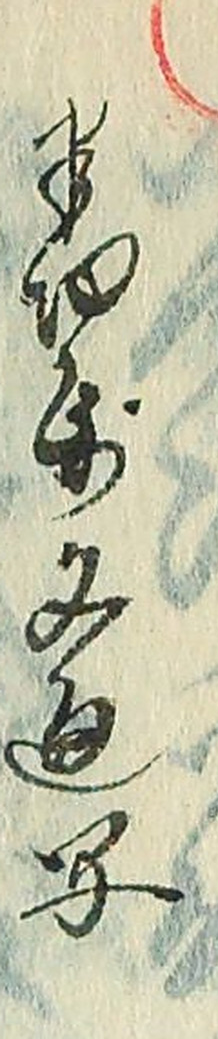半切帋文通写
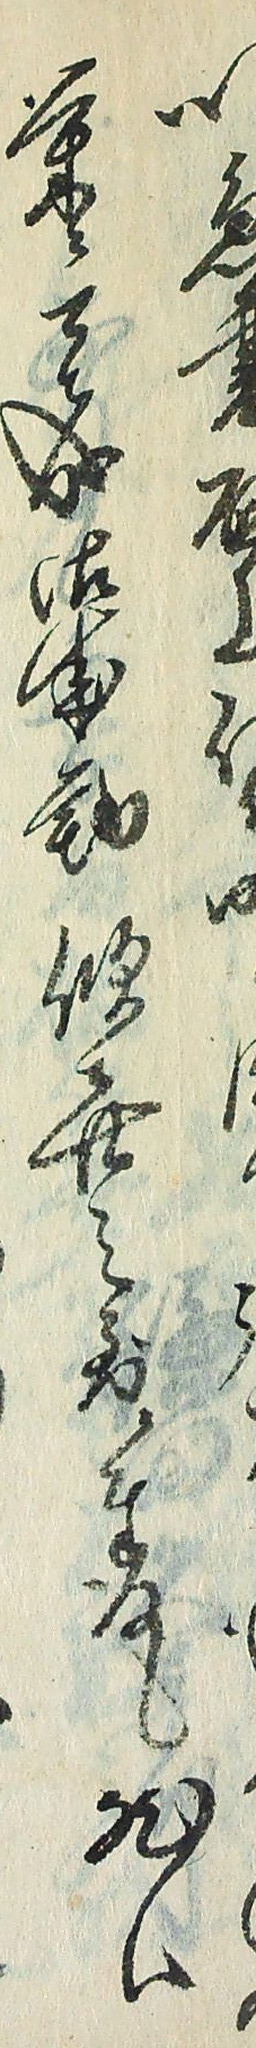栄可被成御成勤欣喜之至ニ奉存候然ハ
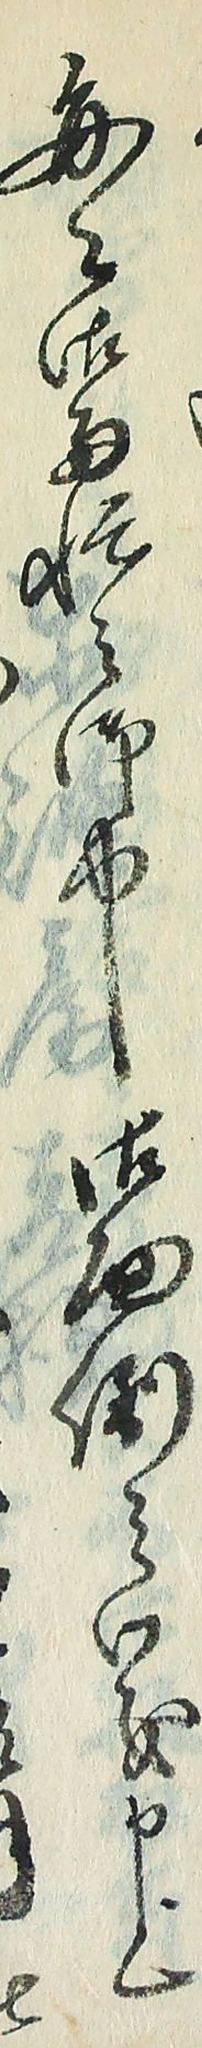毎々御多忙之御中御面倒之御義申上
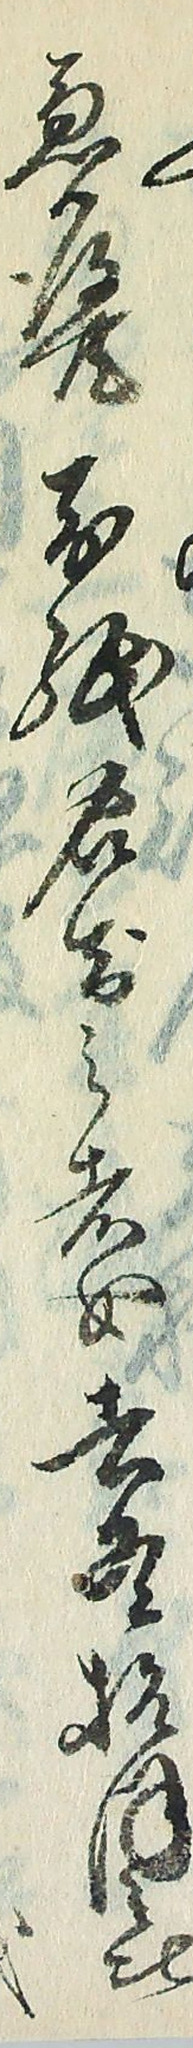兼候得共別紙名前之者義去冬拾月之比
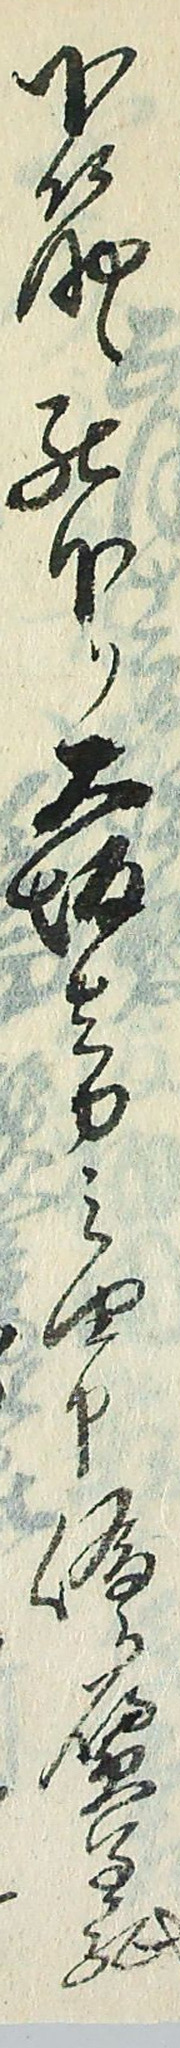下筋へ罷下り大坂与力之由申偽り贋差紙
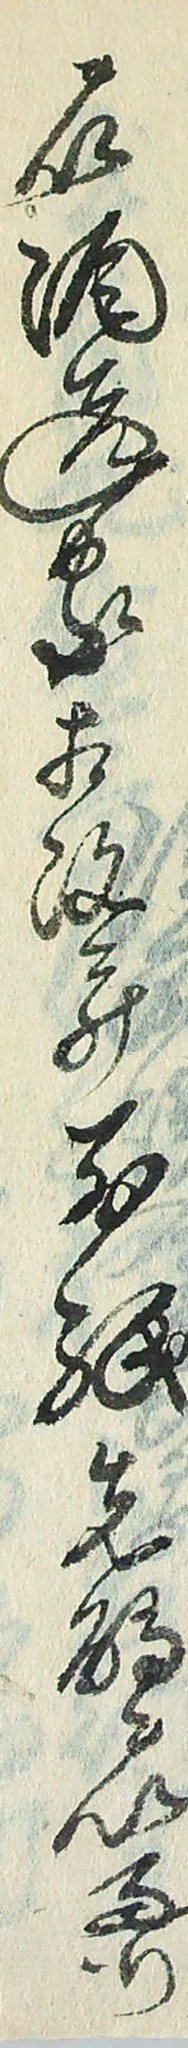ヲ以酒造家相改幷別紙先觸ヲ以通行
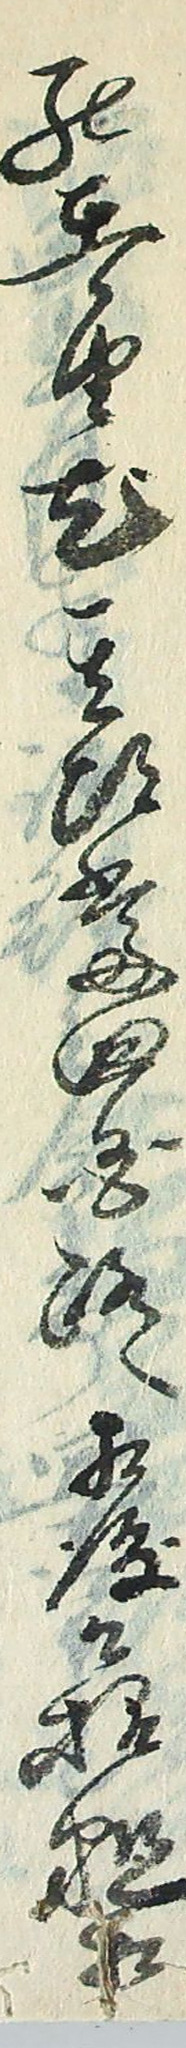罷在候由尤其頃當四国路へ相渡候様粗相
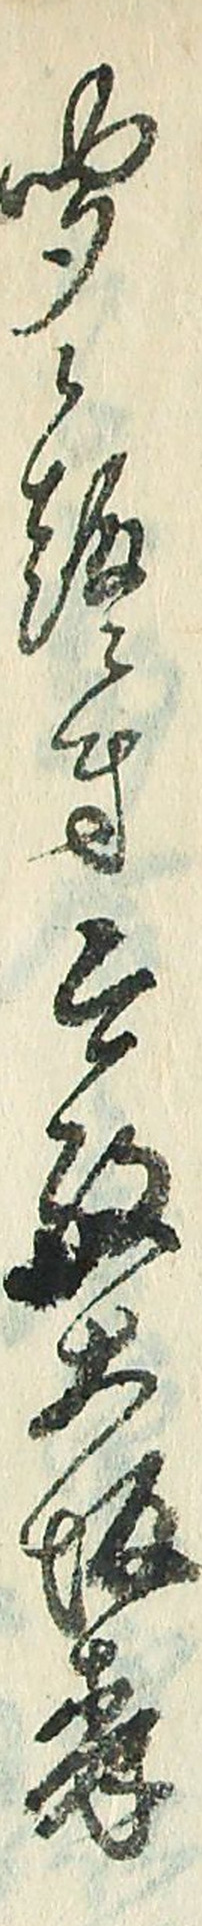聞候趣ニ付今般大坂表
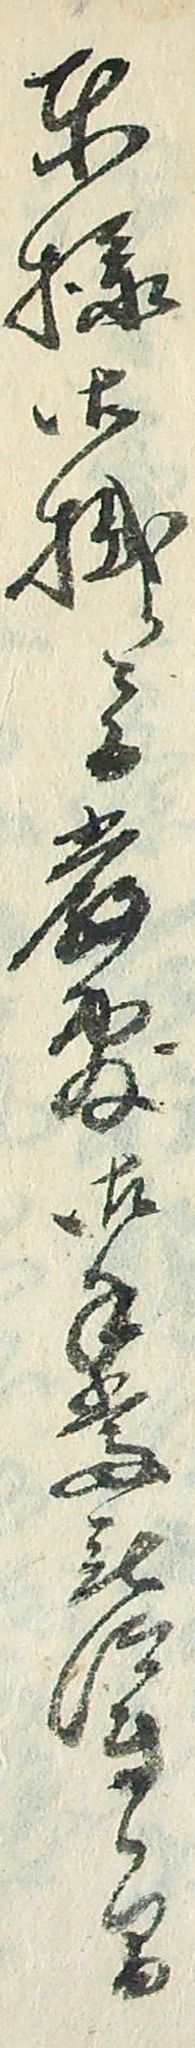東様御掛りニ而厳敷御手當被仰付候間
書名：諸御趣意書并御下知向之写
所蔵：鳴門教育大学 Naruto University of Education
